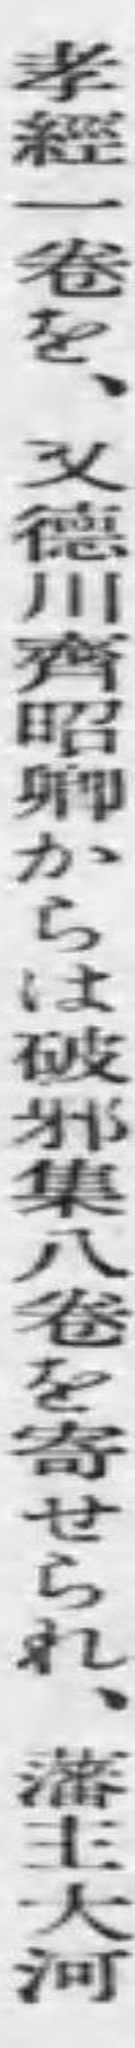孝経一巻を、又徳川斉昭卿からは破邪集八巻を寄せられ、藩主大河
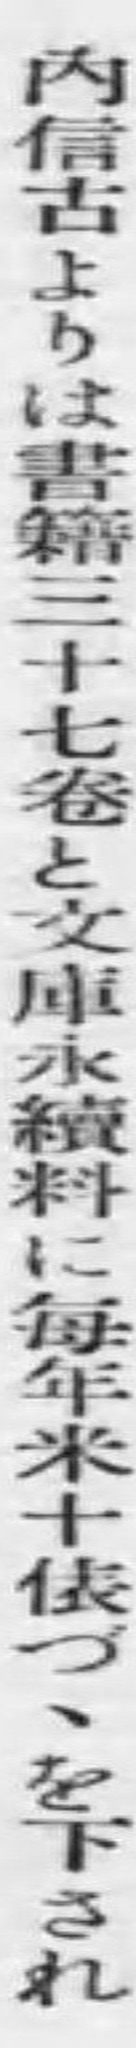内信古よりは書籍三十七巻と文庫永続料に毎年米十俵づゝを下され

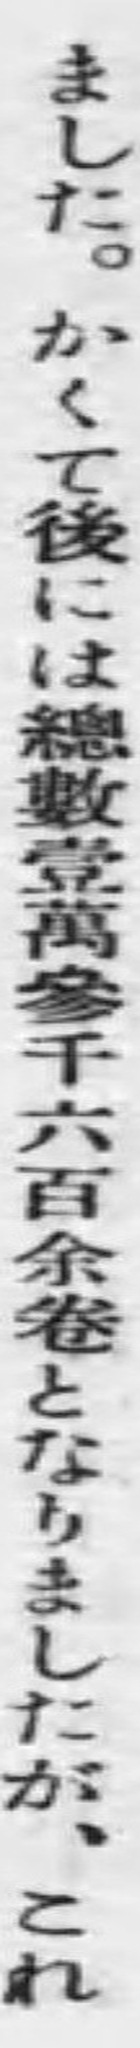ました。かくて後には総数壱万参千六百余巻となりましたが、これ
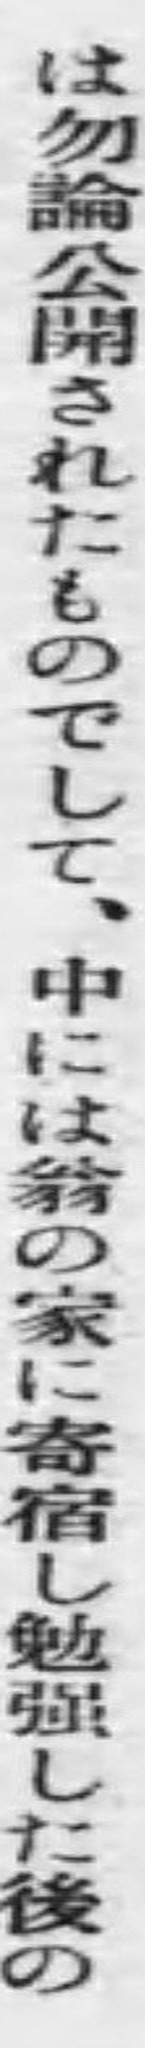は勿論公開されたものでして、中には翁の家に寄宿し勉強した後の
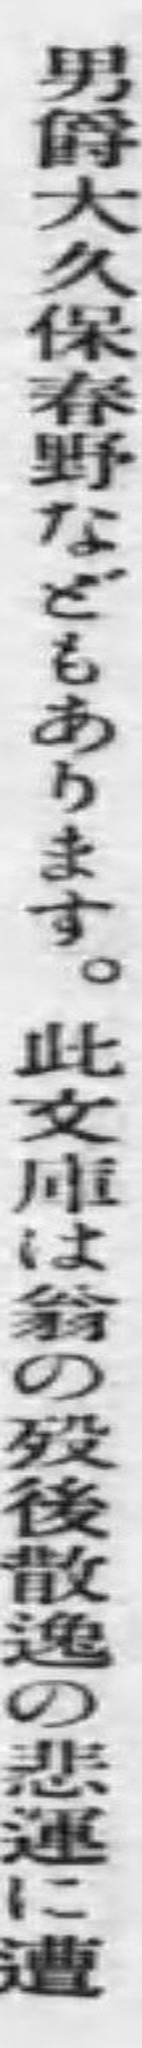男爵大久保春野などもあります。此文庫は翁の歿後散逸の悲運に遭
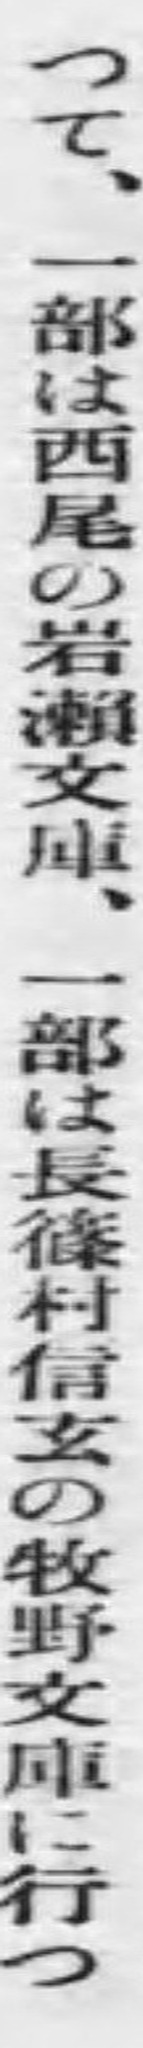つて、一部は西尾の岩瀬文庫、一部は長篠村信玄の牧野文庫に行つ
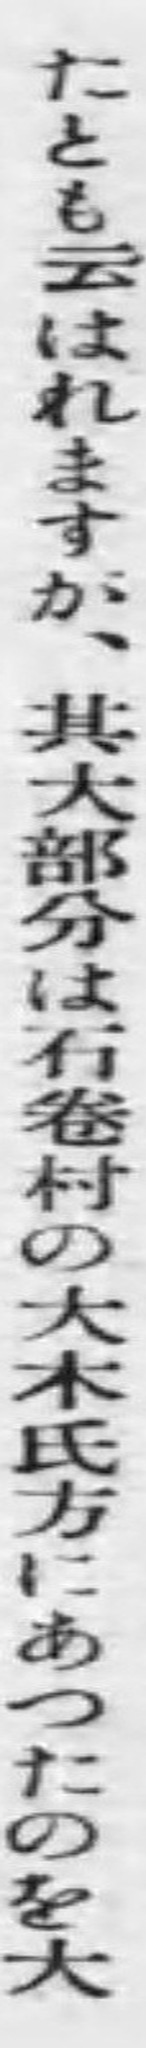たとも云はれますが、其大部分は石巻村の大木氏方にあつたのを大
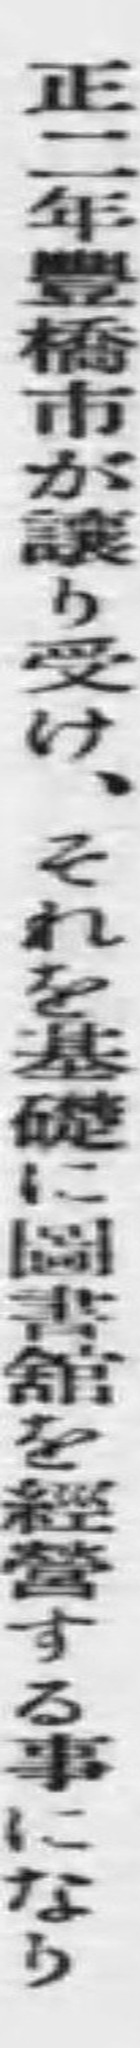正二年豊橋市が譲り受け、それを基礎に図書館を経営する事になり
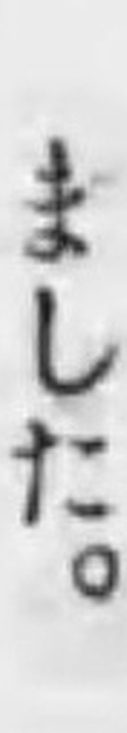ました。
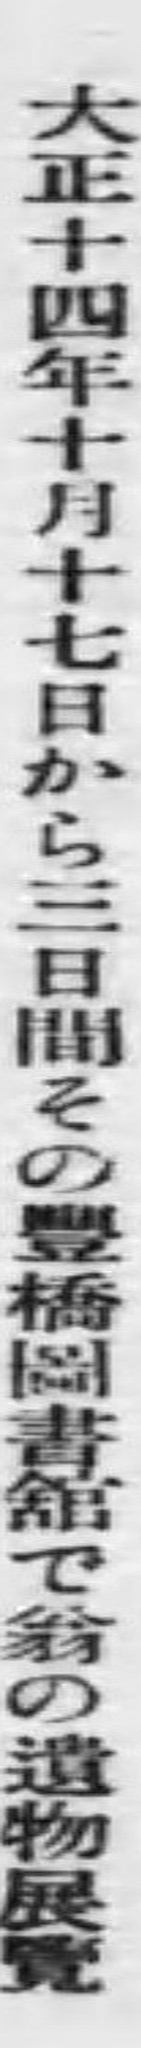大正十四年十月十七日から三日間その豊橋図書館で翁の遺物展覧
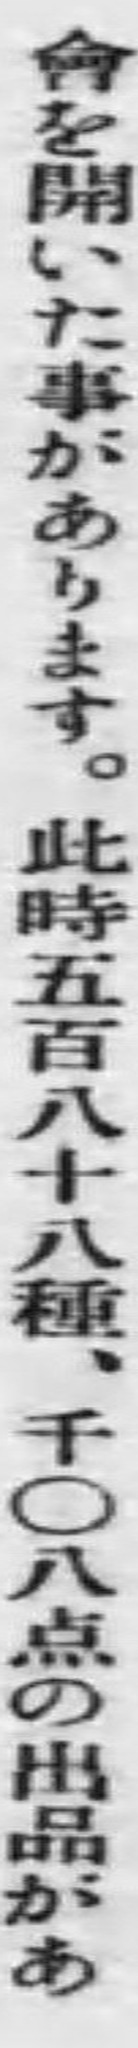会を開いた事があります。此時五百八十八種、千〇八点の出品があ
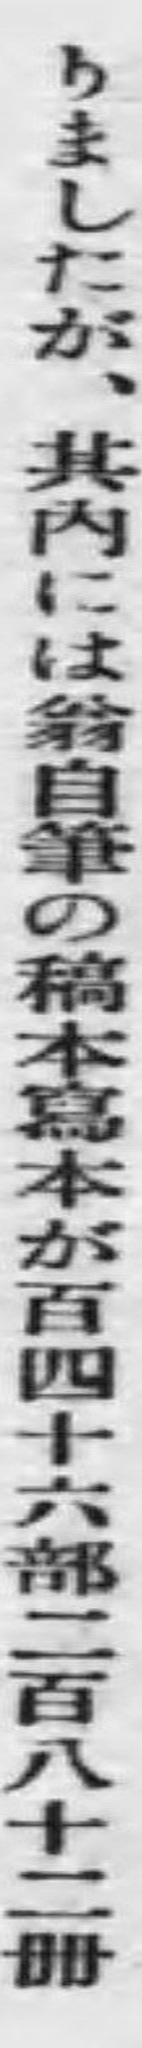りましたが、其内には翁自筆の稿本写本が百四十六部二百八十二冊
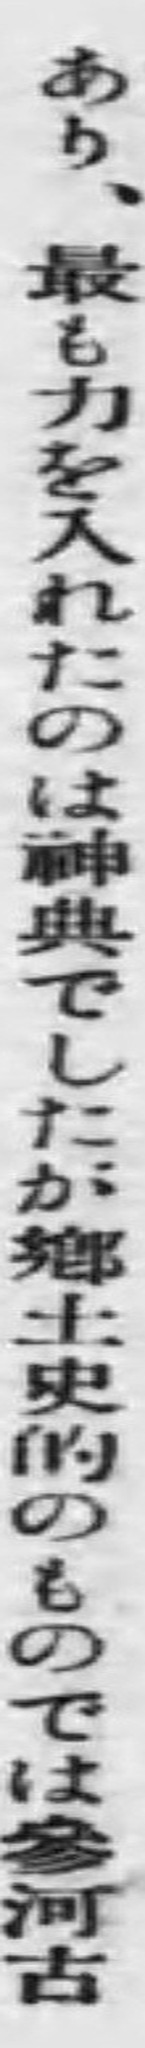あり、最も力を入れたのは神典でしたが郷土史的のものでは参河古
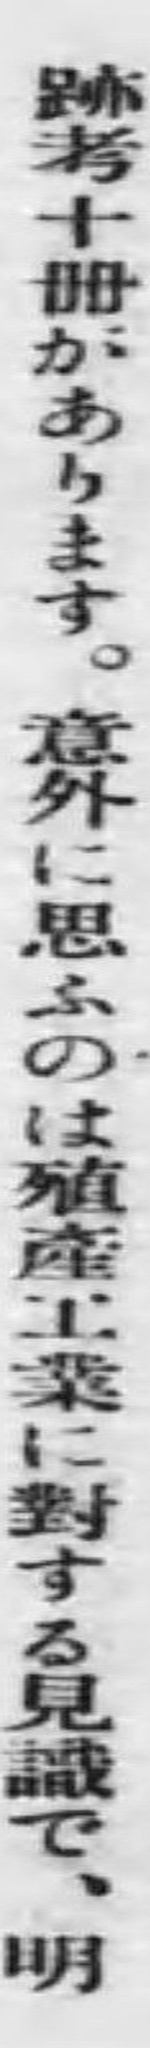跡考十冊があります。意外に思ふのは殖産工業に対する見識で、明
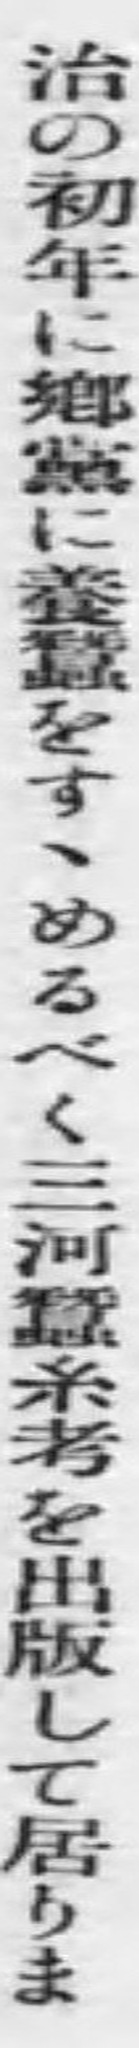治の初年に郷党に養蚕をすゝめるべく三河蚕糸考を出版して居りま
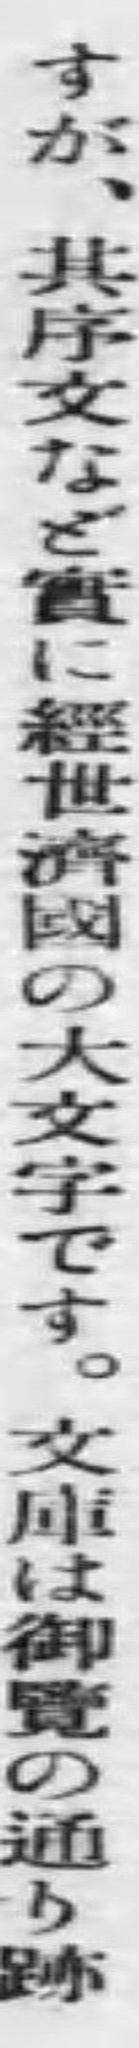すが、其序文など実に経世済国の大文字です。文庫は御覧の通り跡
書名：東三河道中記 : 豊橋市及其附近案内
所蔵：国立国会図書館 National Diet Library, JAPAN
